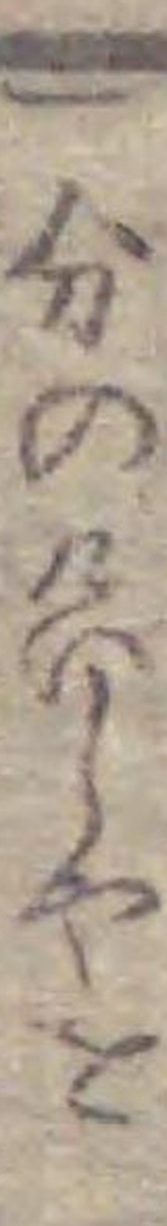一分のけいしやを
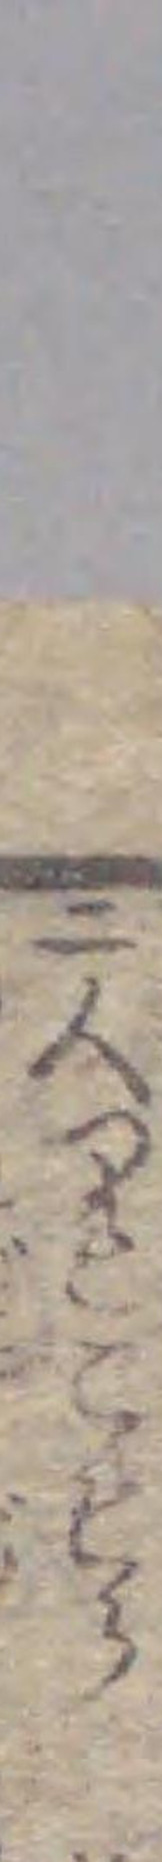二人つれこれら
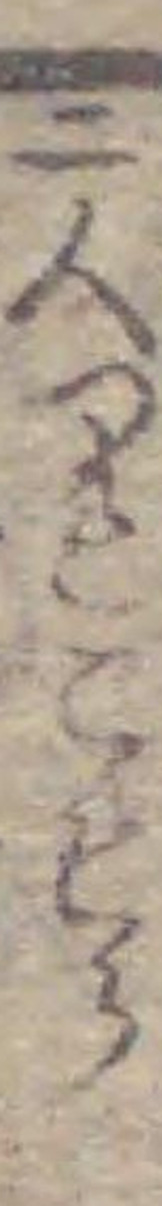二人つれこれら
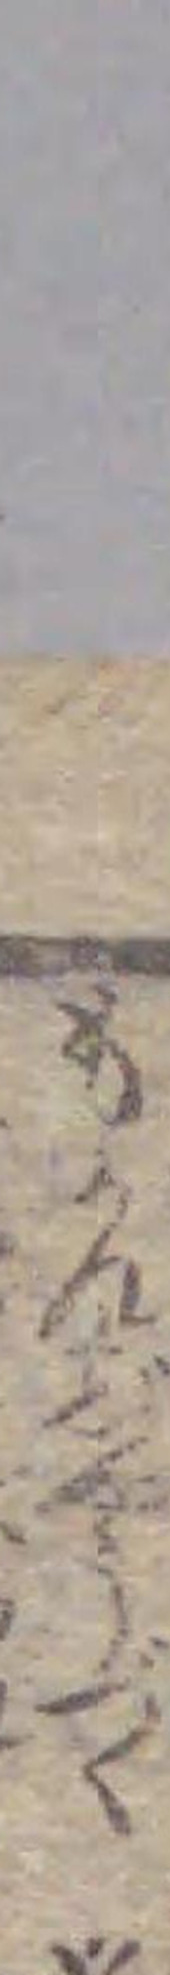もかんじやうづく
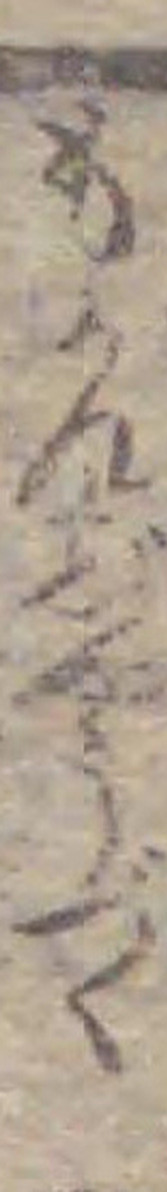もかんじやうづく
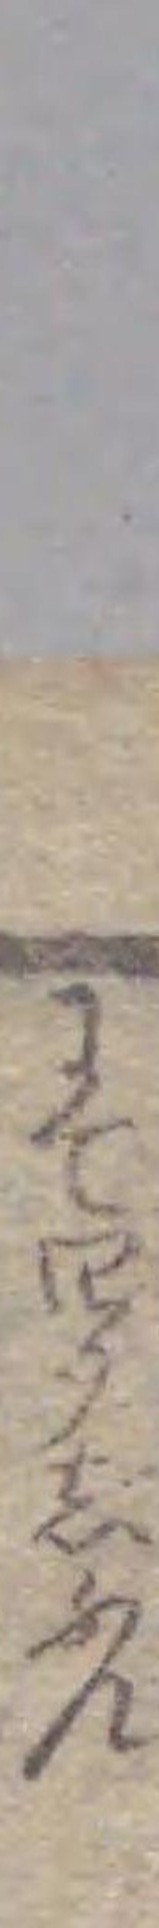にて四じふん
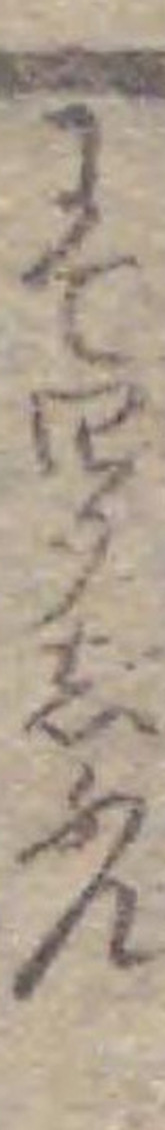にて四じふん
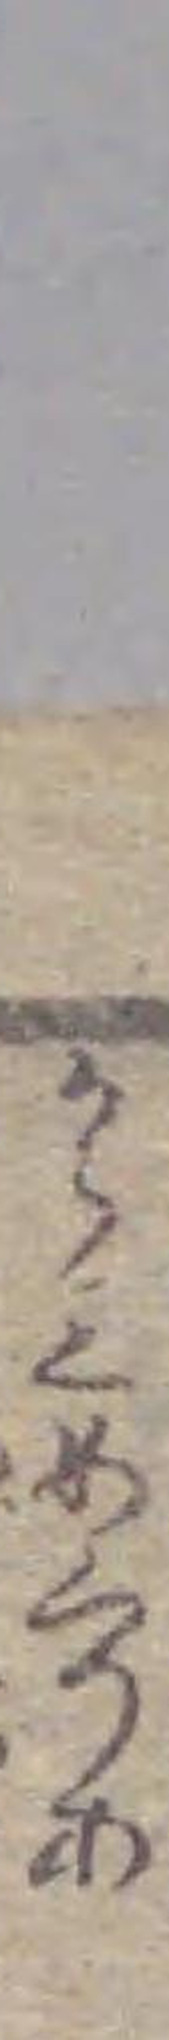から三めくりあ
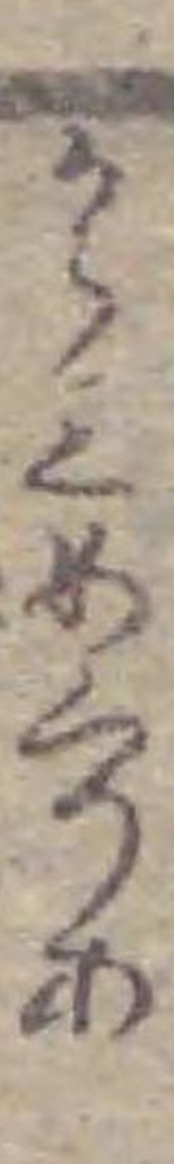から三めくりあ
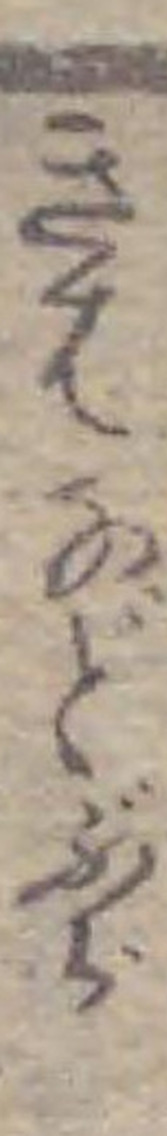きはなどぶら
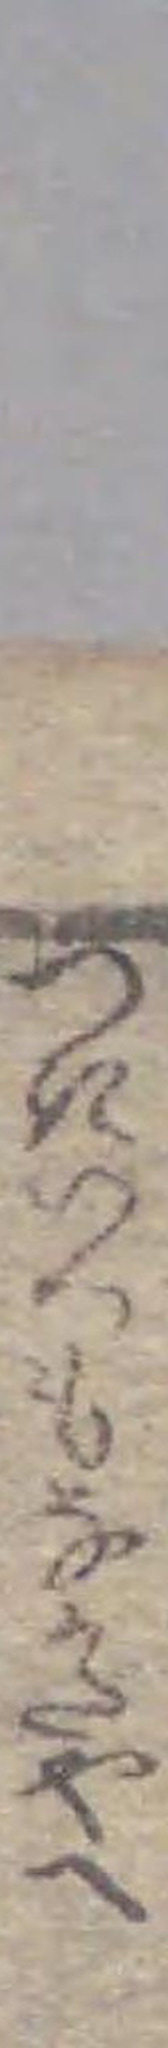つきいつもなかたやへ
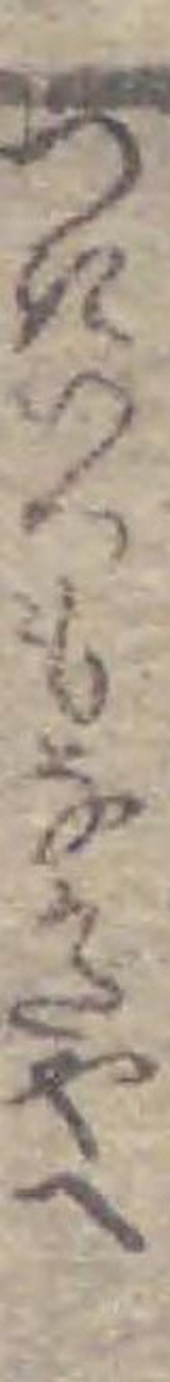つきいつもなかたやへ
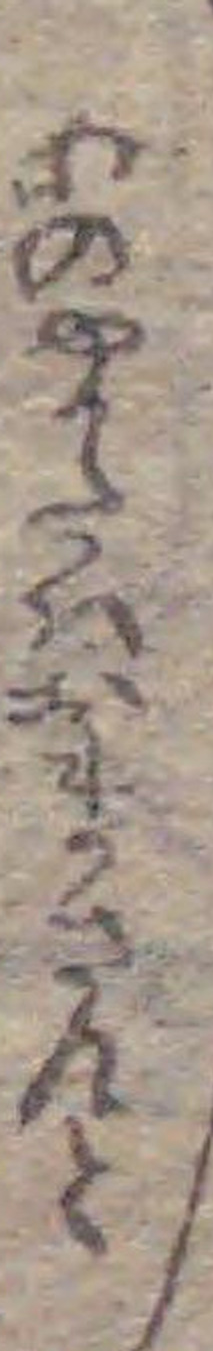あのやかたはおまさんと
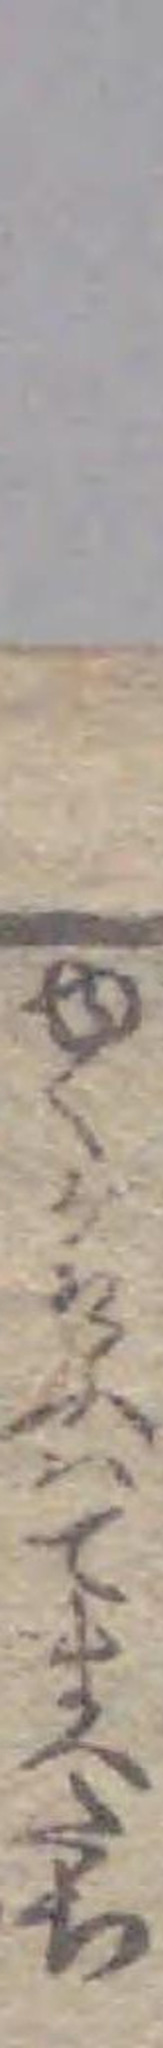ゆくがけふはてまへたち
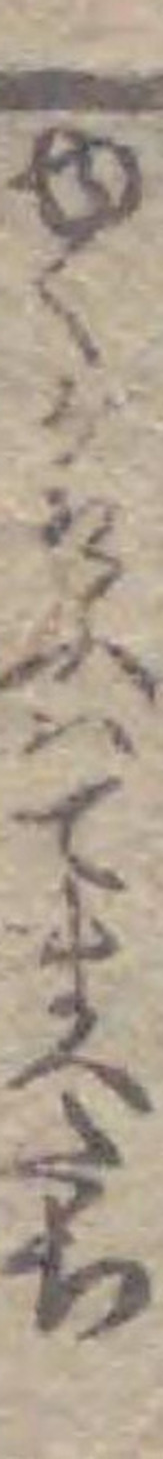ゆくがけふはてまへたち
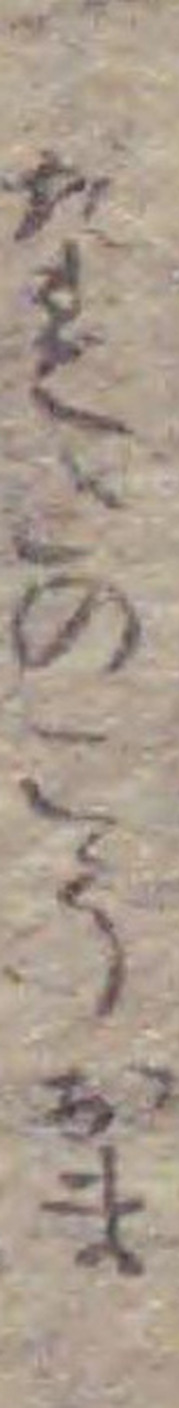だれたのこうおま
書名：紺屋百物語 : 3巻
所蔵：国立国会図書館 National Diet Library, JAPAN
